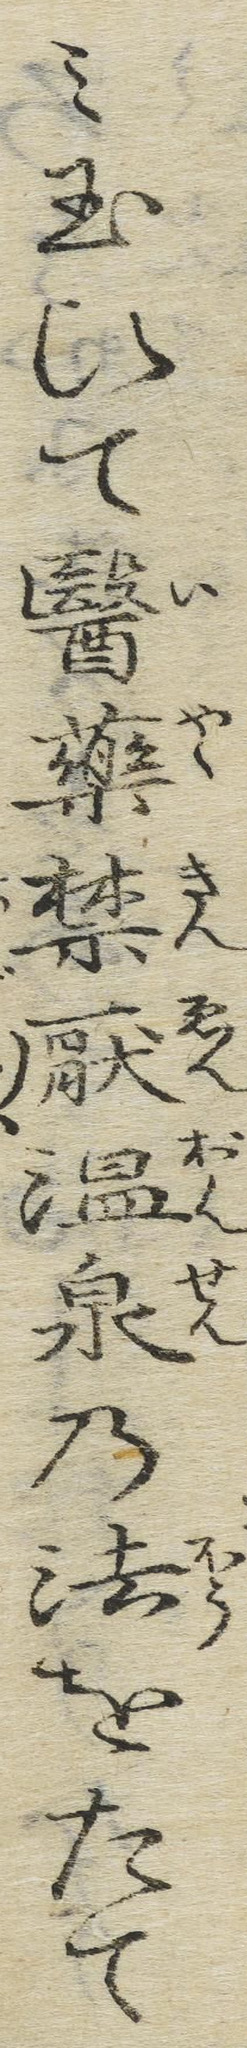み玉ひて医薬禁厭温泉の法をたて
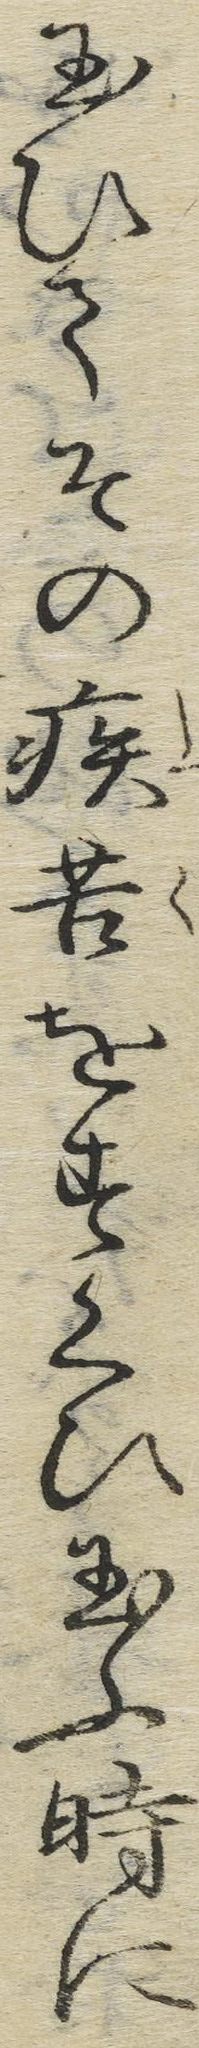玉ひてその疾苦をすくひ玉ふ時に
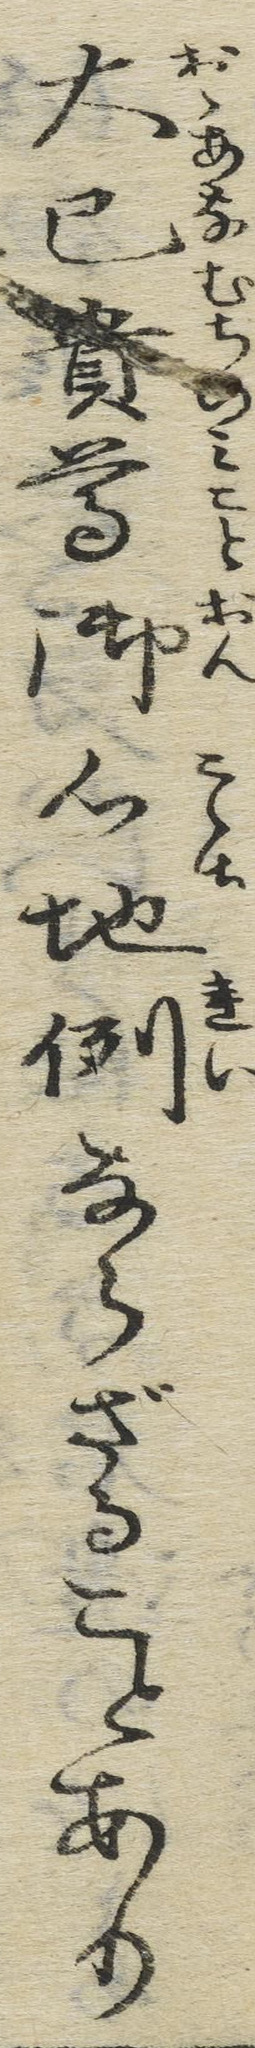大巳貴尊御心地例ならざることあり
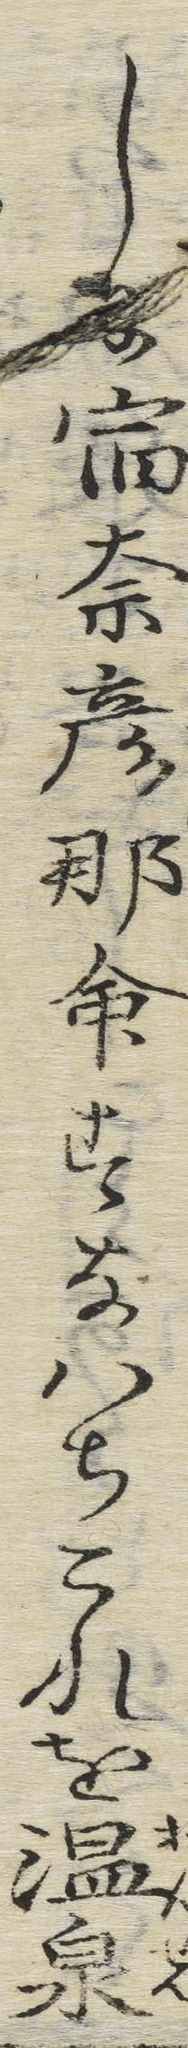しに宿奈彦那命すなはちこれを温泉
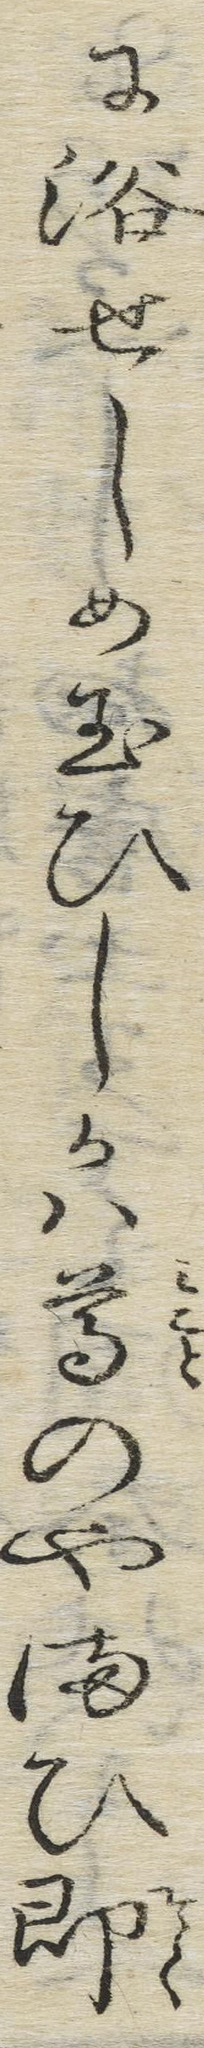に浴せしめ玉ひしかは尊のやまひ即
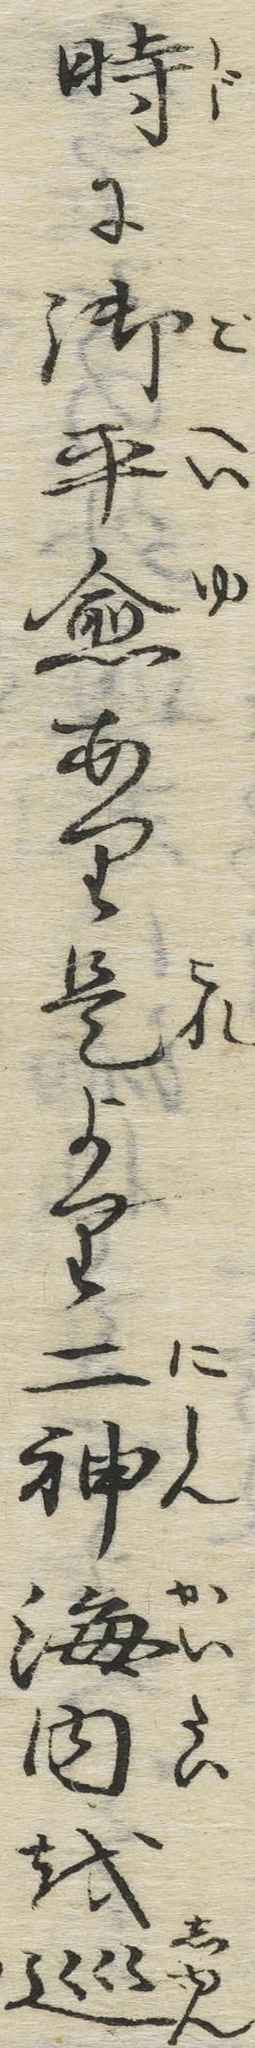時に御平愈あり是より二神海内を巡
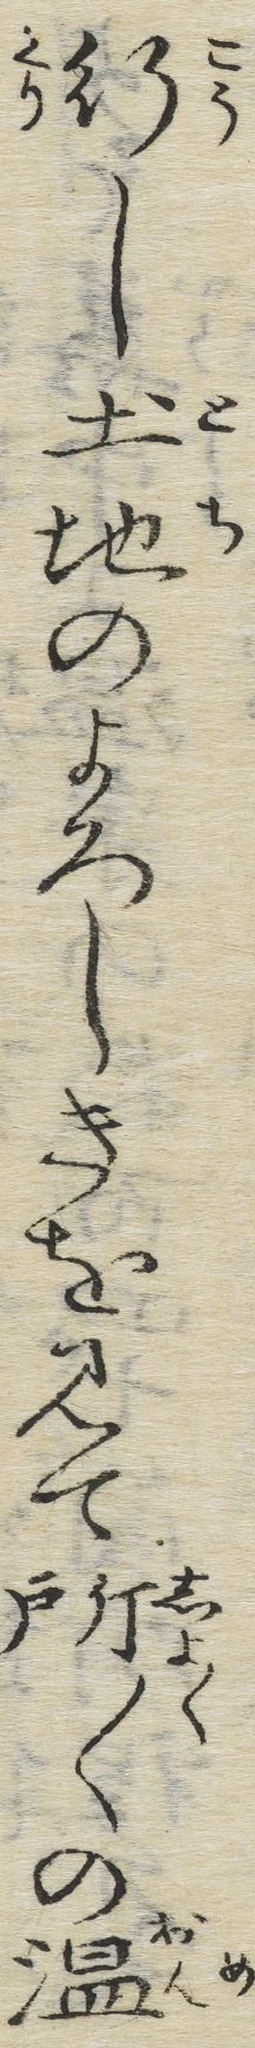行し土地のよろしきを見て所〳〵の温
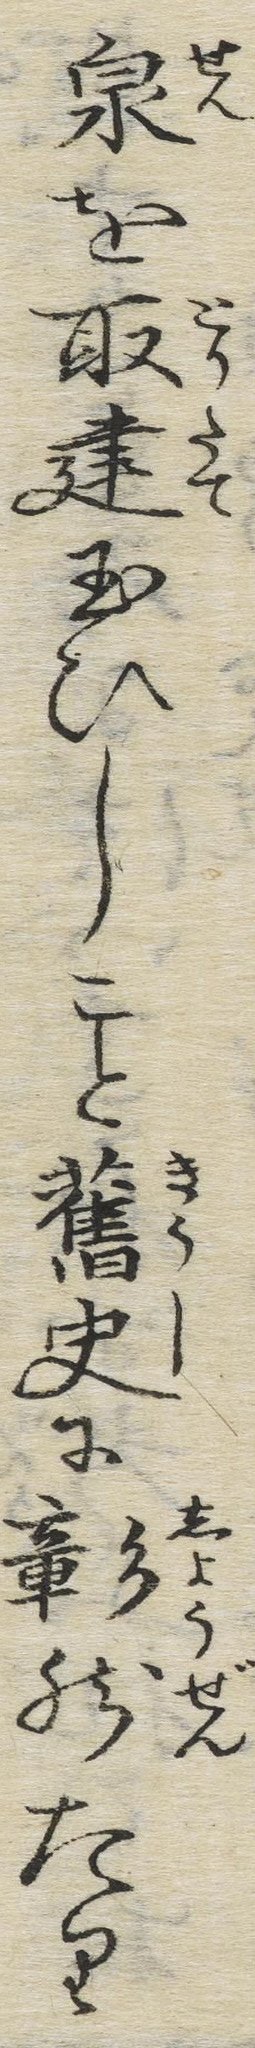泉を取建玉ひしこと旧史に彰然たり
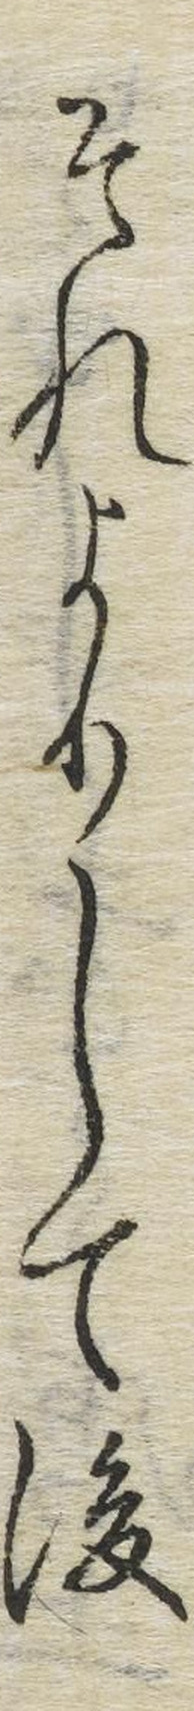それよりして後
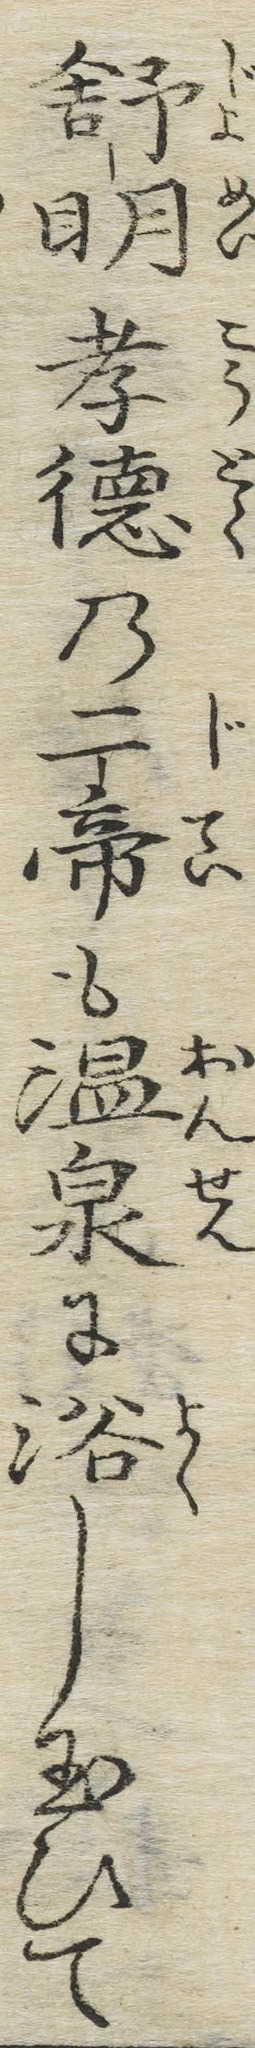舒明孝徳の二帝も温泉に浴し玉ひて
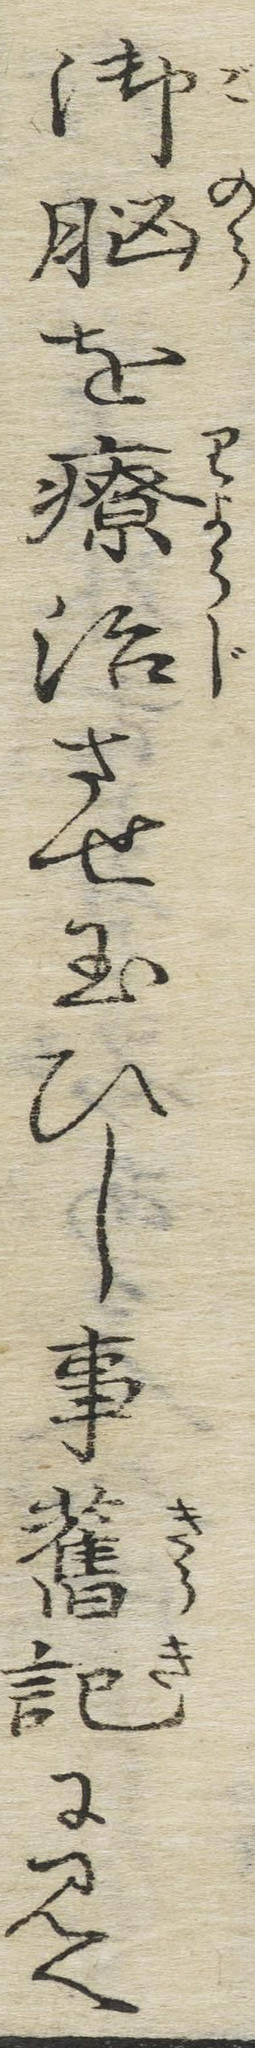御脳を療治させ玉ひし事旧記に見へ

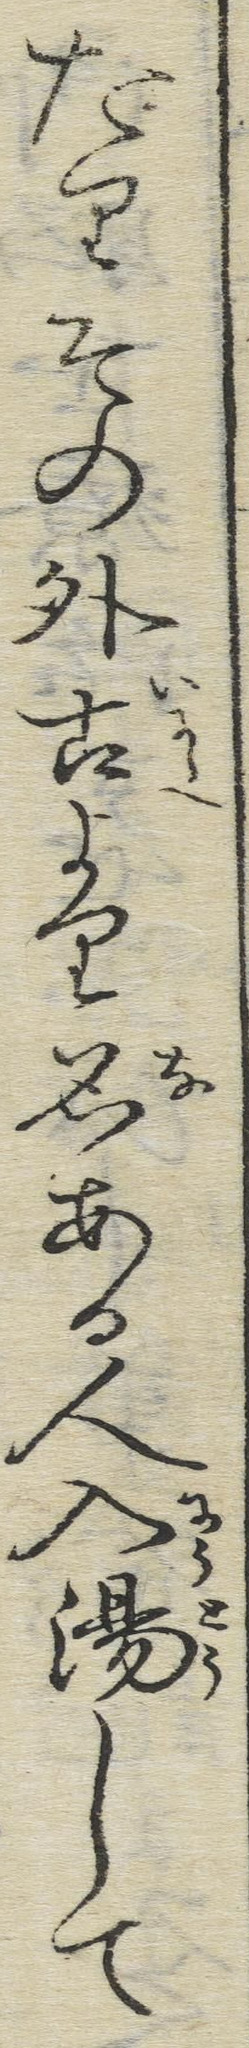たりその外古より名ある人入湯して
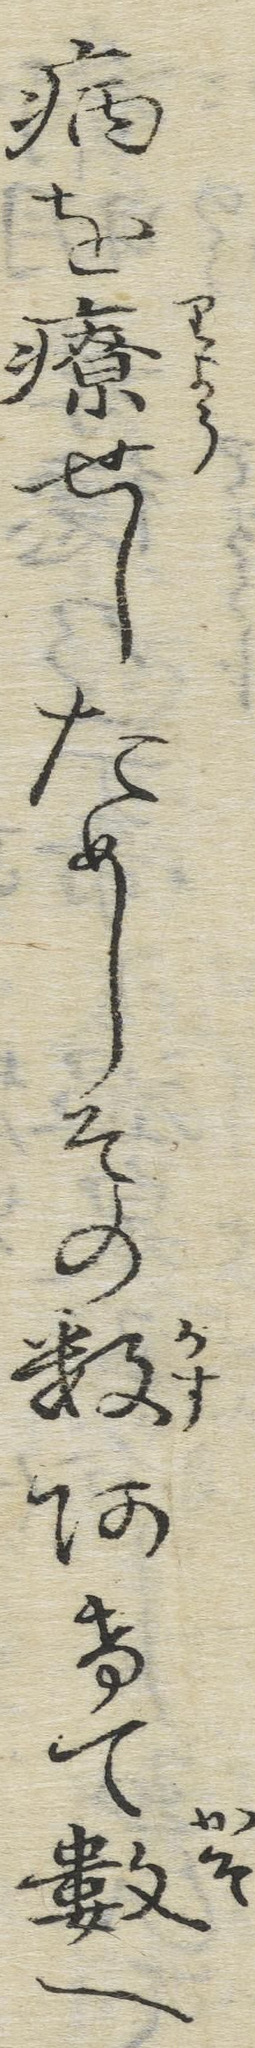病を療せしためしその数あけて数へ
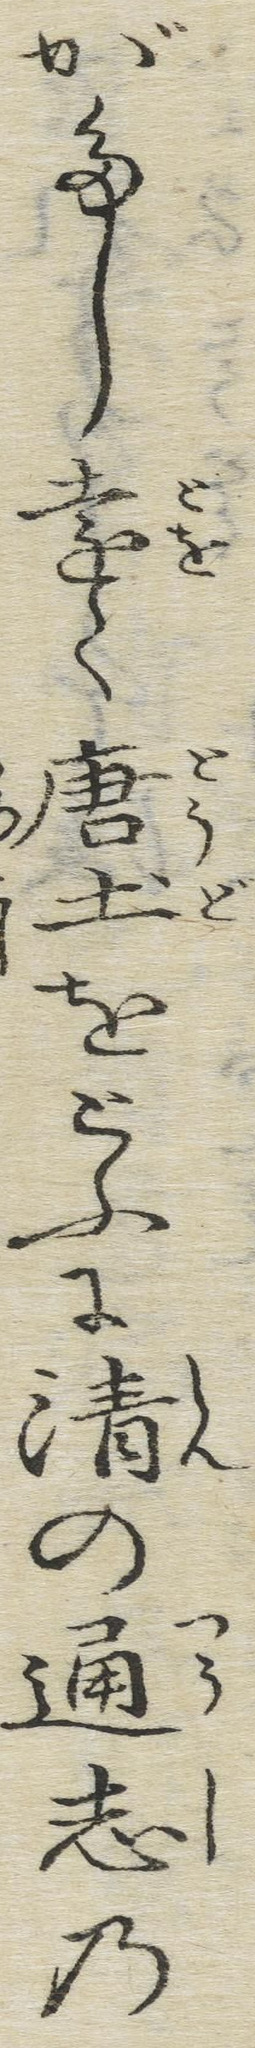がたし遠く唐土をとふに清の通志の
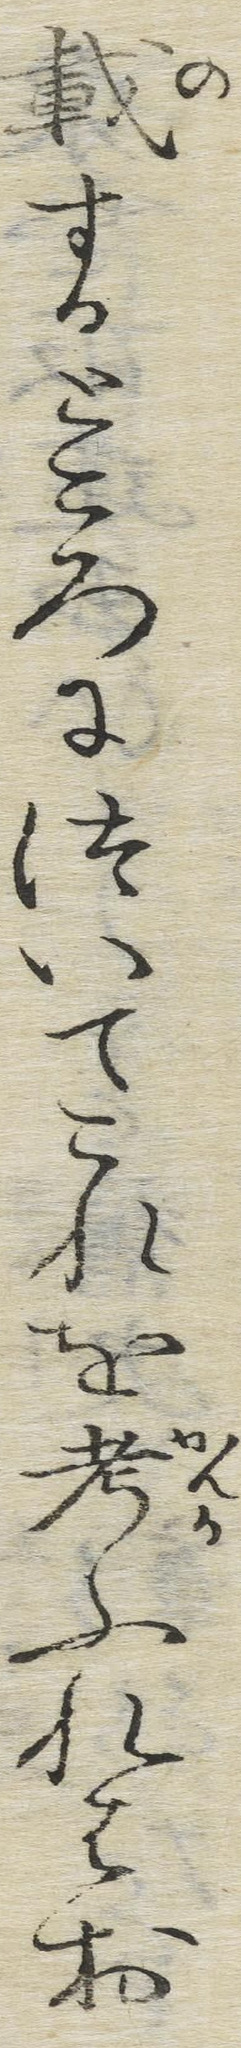載するところについてこれを考ふれはお
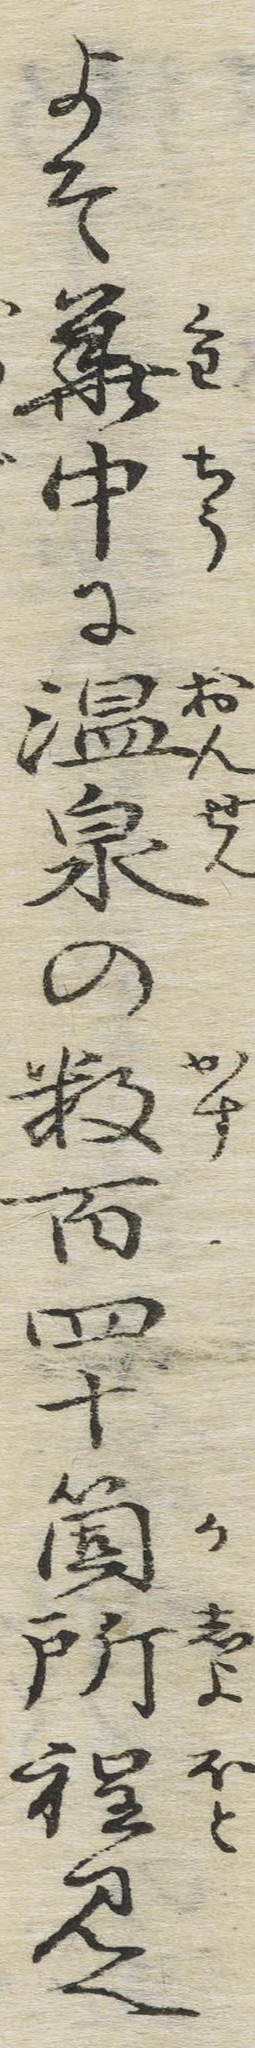よそ華中に温泉の数百四十箇所程見へ
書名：温泉考
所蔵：東京大学地震研究所図書室 Earthquake Research Institute Library, The University of Tokyo, JAPAN
